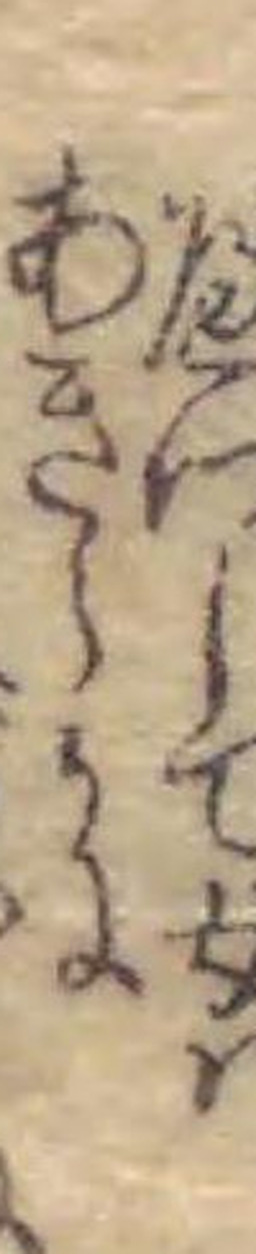あきらかに
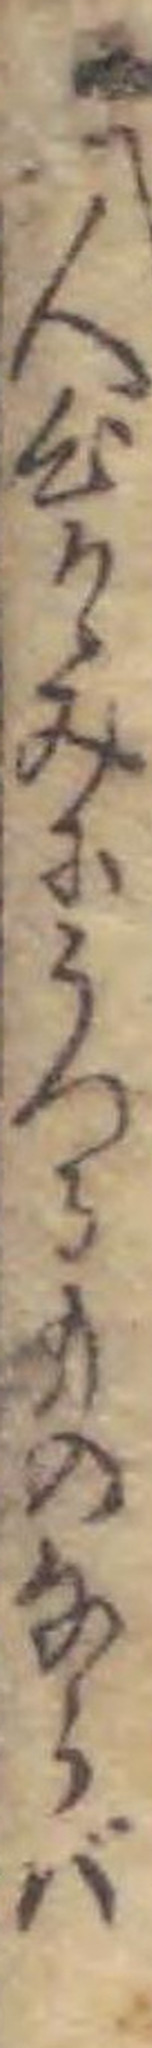〽人心かゝみにうつるものならば
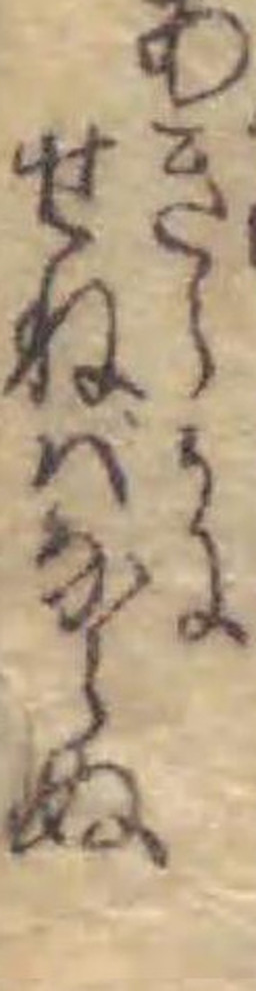せねばならぬ
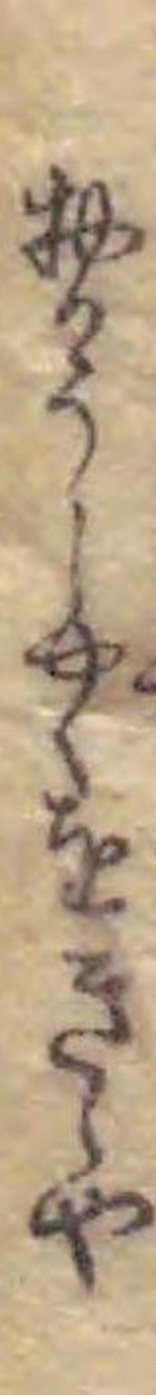おかうしやくをきゝや
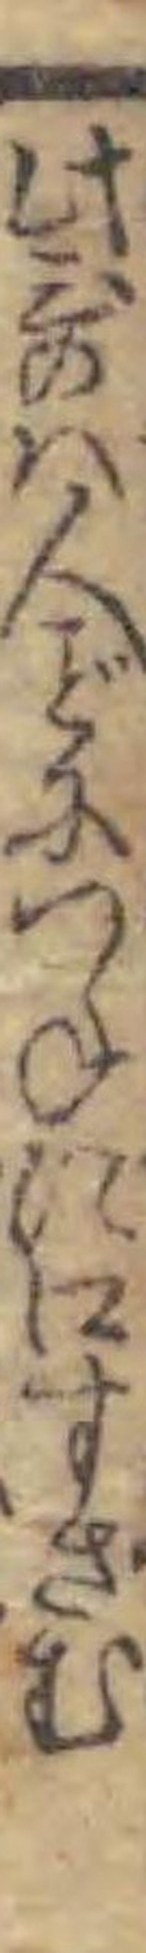此哥は人ごとにつねに口すさむ
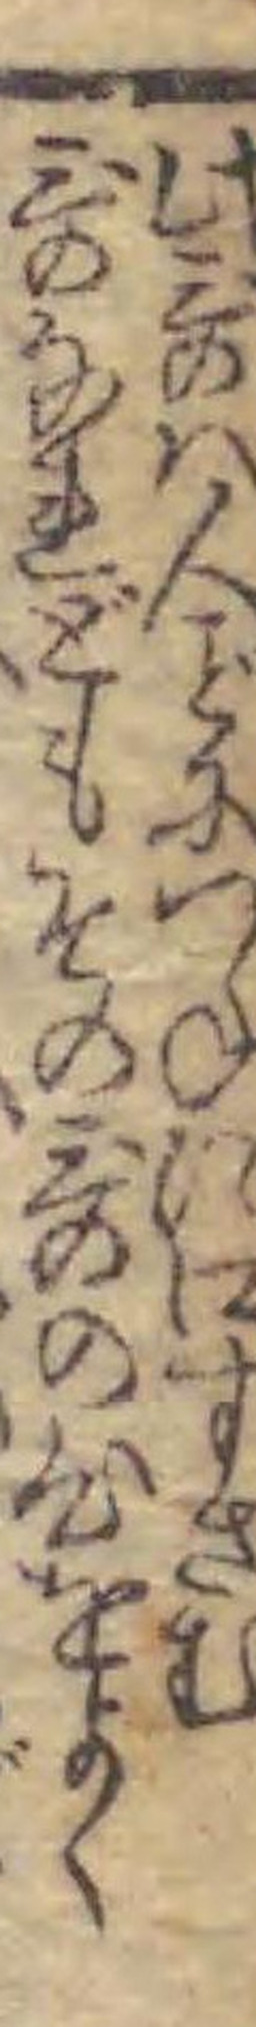哥なれどもその哥の心をよく
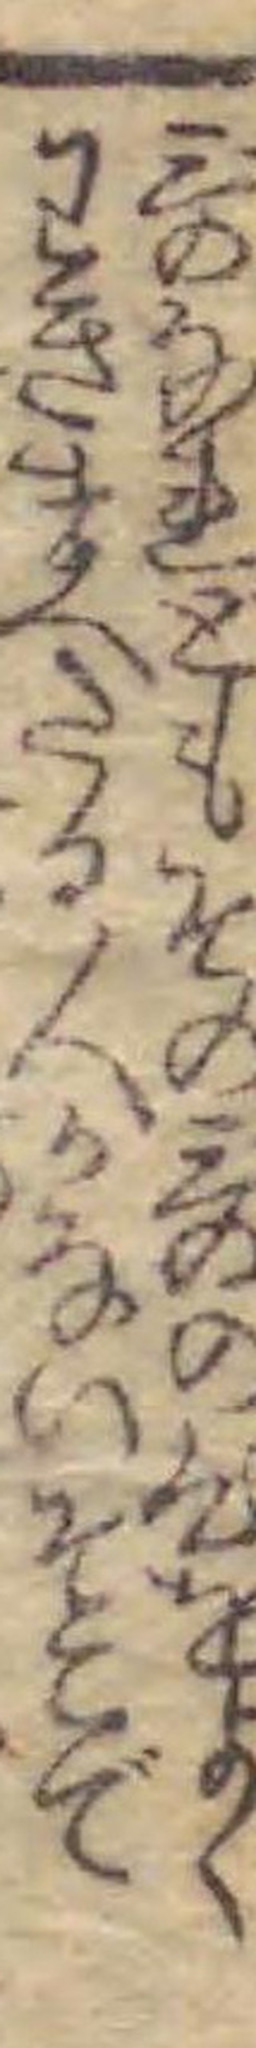わきまへたる人かないそこで
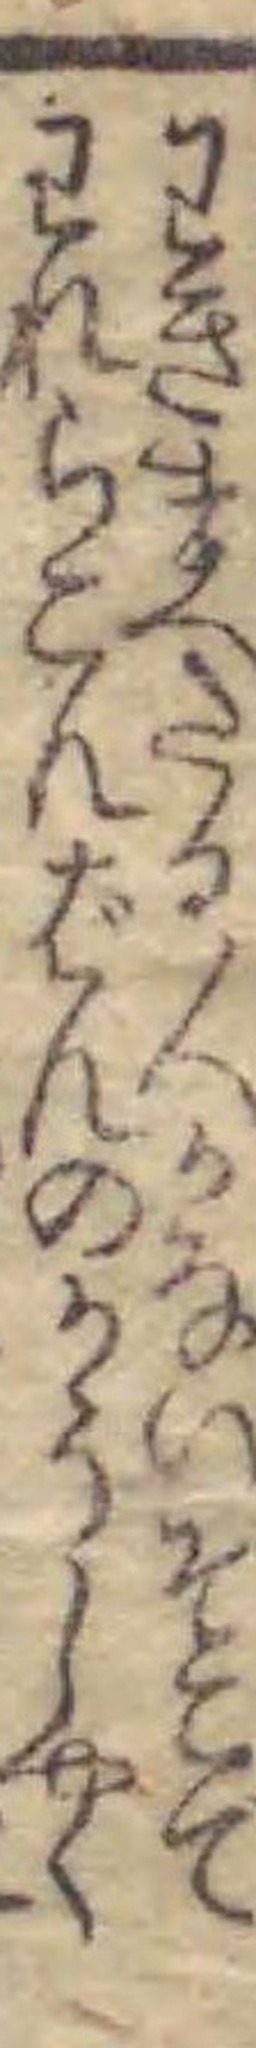われらこんばんのかうしやく
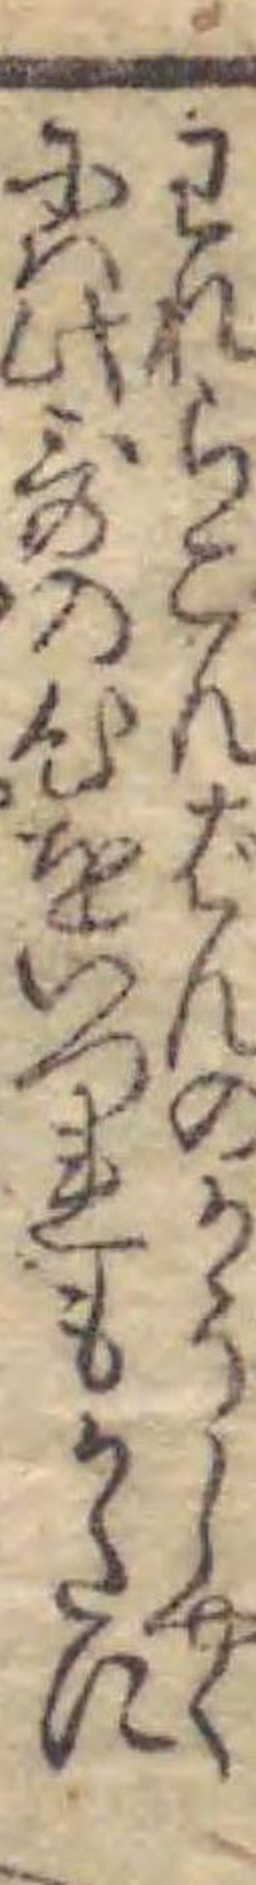には此哥の心をいづれもかたに
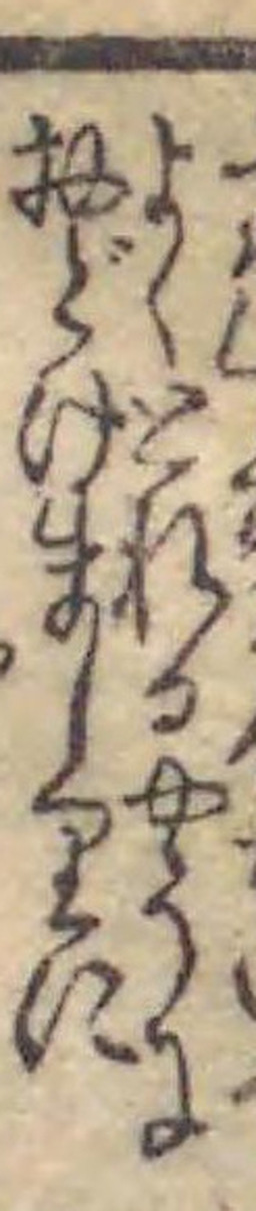おどけましりに
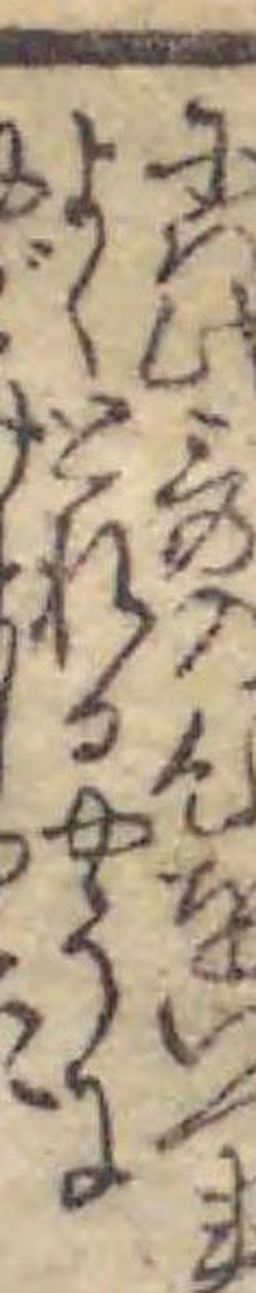よくとれるやうに
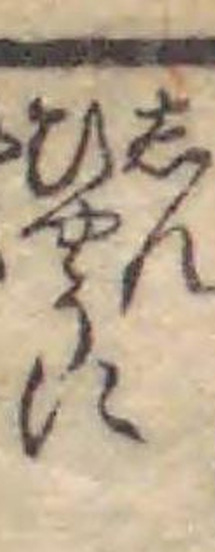ひやうに
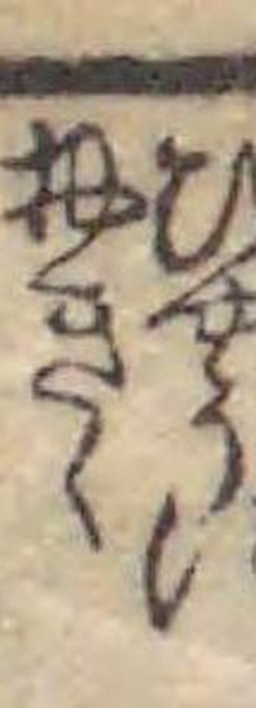おきゝ
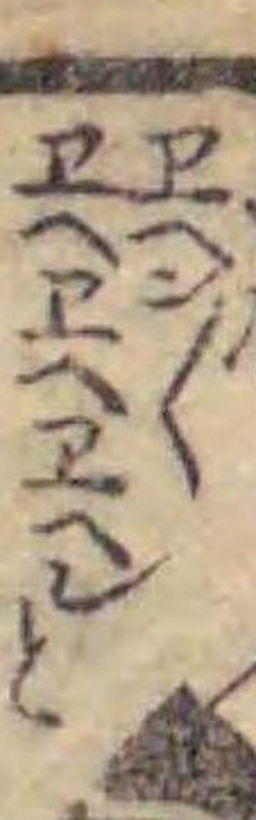ヱヘヱヘヱヘンと
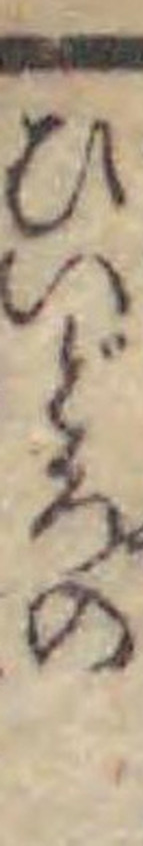ひいどろの
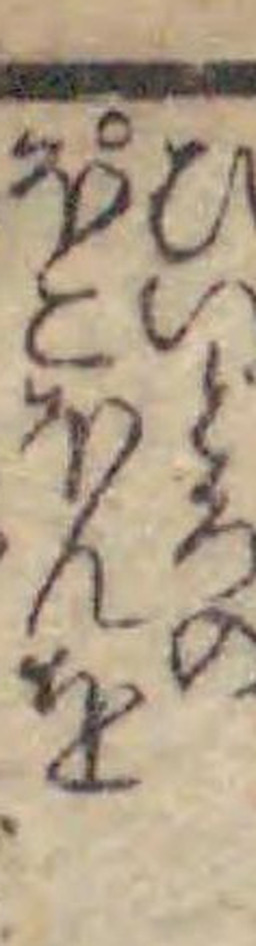ぽこほんを
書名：人心鏡写絵 : 3巻
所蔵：国立国会図書館 National Diet Library, JAPAN
